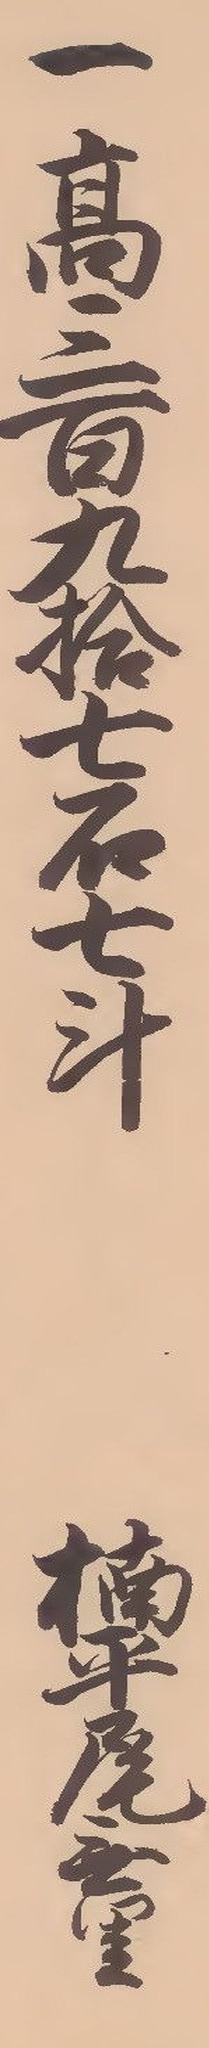一高三百九拾七石七斗楠平尾無里
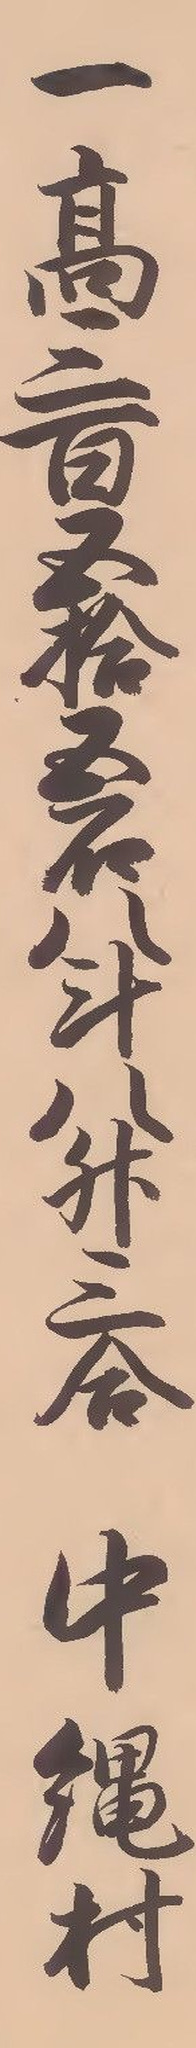一高三百五拾五石八斗八升三合中縄村
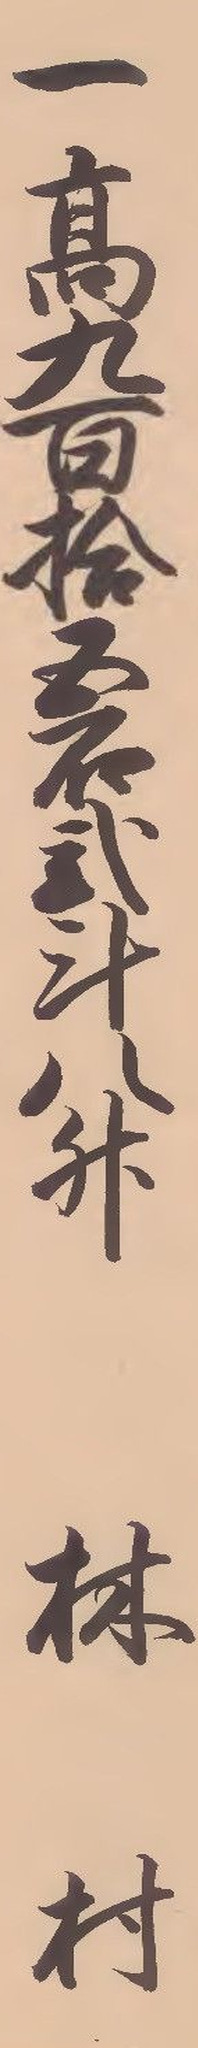一高九百拾五石弐斗八升林村
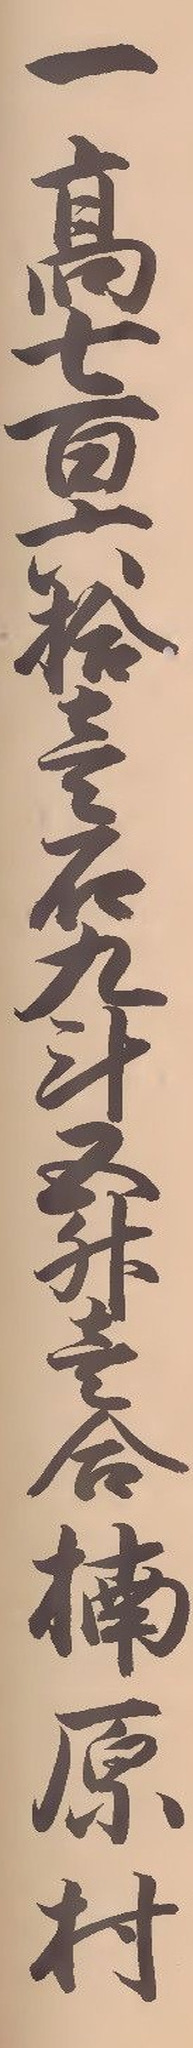一高七百六拾壱石九斗五升壱合楠原村
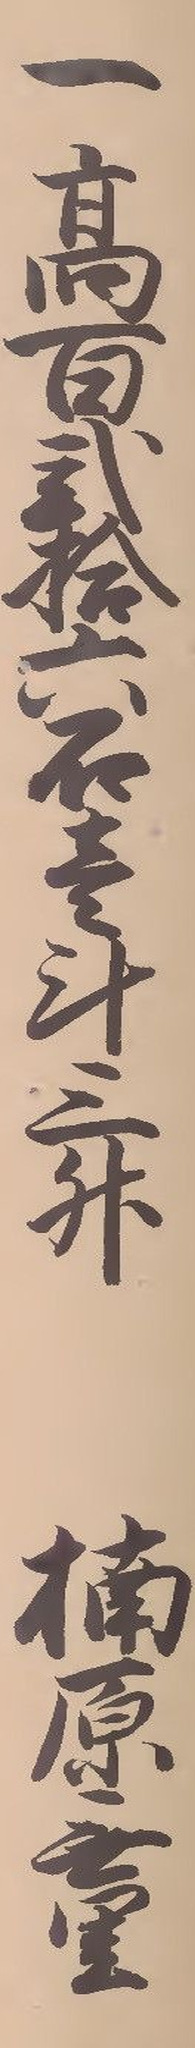一高百弐拾六石壱斗三升楠原無里
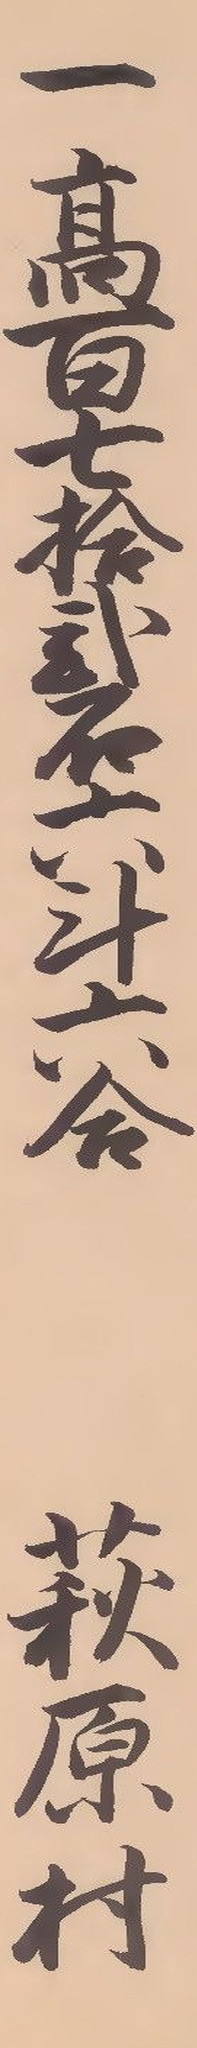一高百七拾弐石六斗六合萩原村
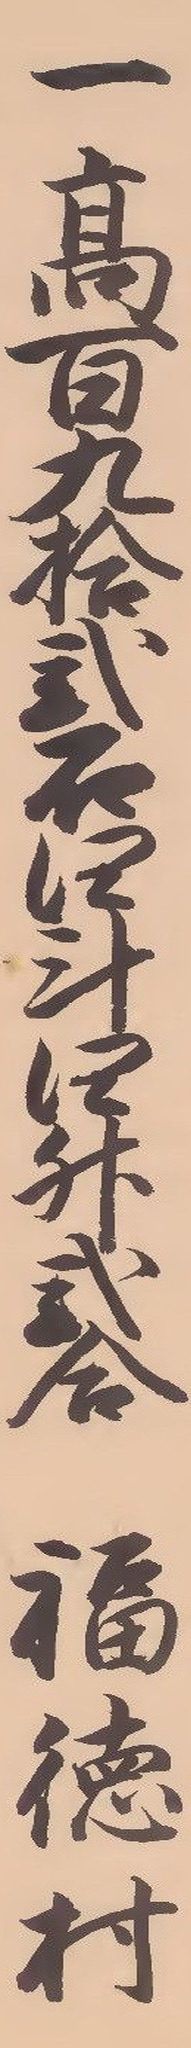一高百九拾弐石四斗四升弐合福徳村
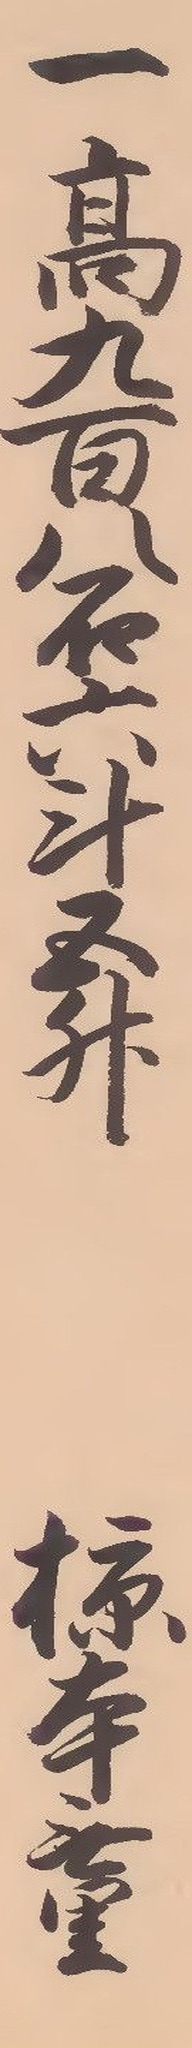一高九百八石六斗五升椋本無里

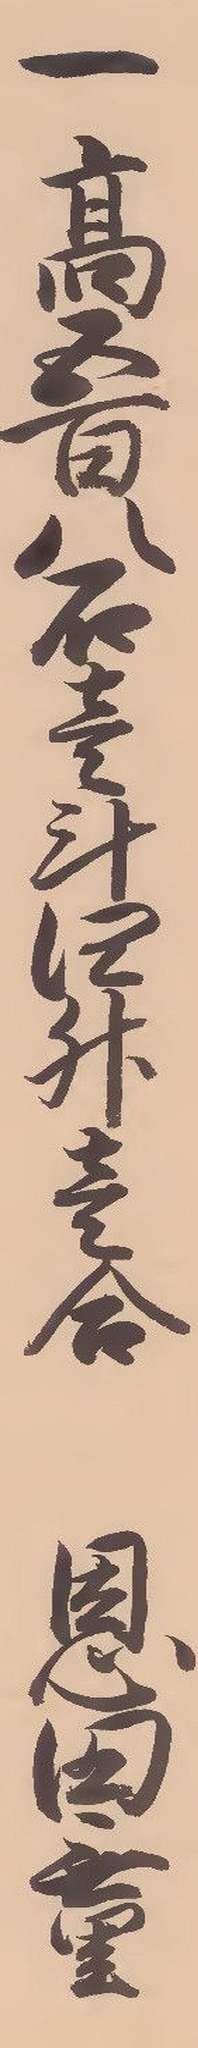一高五百八石壱斗四升壱合恩田無里
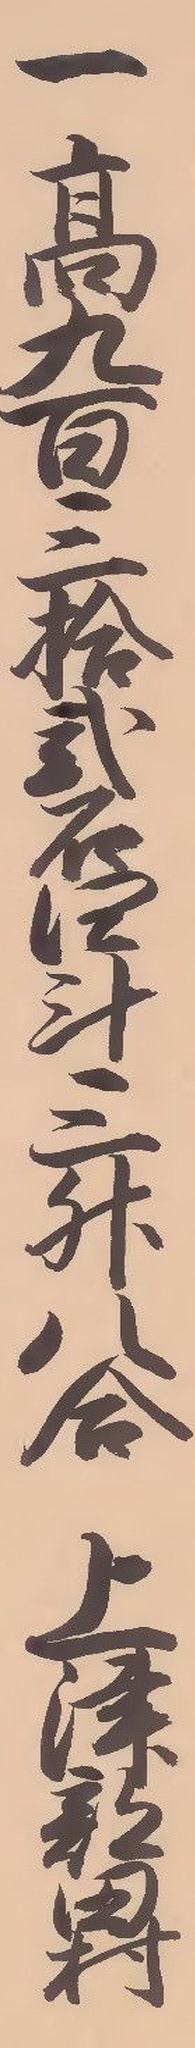一高九百三拾弐石四斗三升八合上津部田村
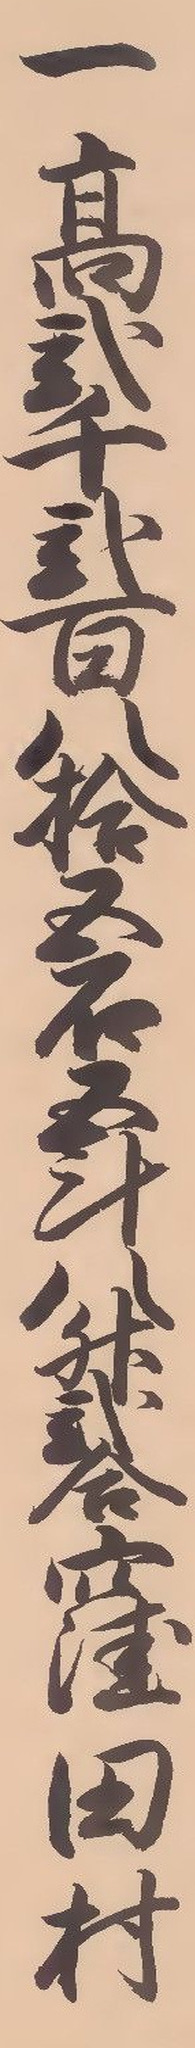一高弐千弐百八拾五石五斗八升弍合窪田村
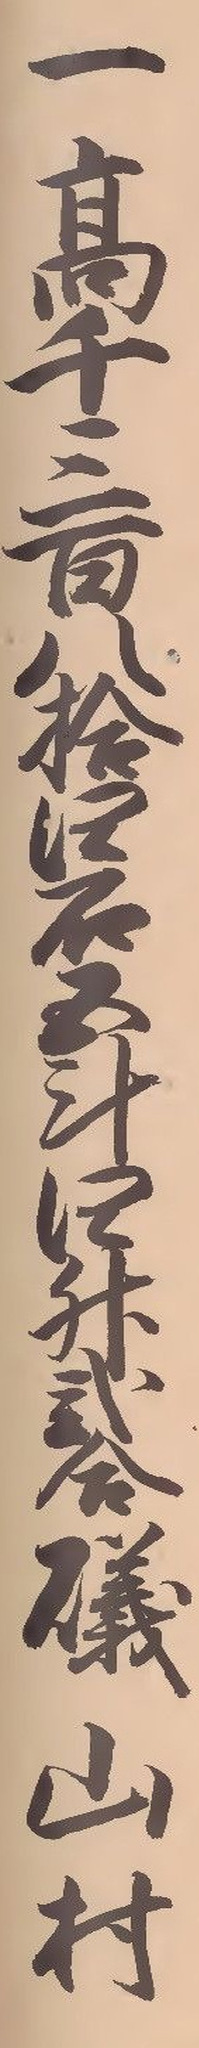一高千三百八拾四石五斗四升弐合磯山村
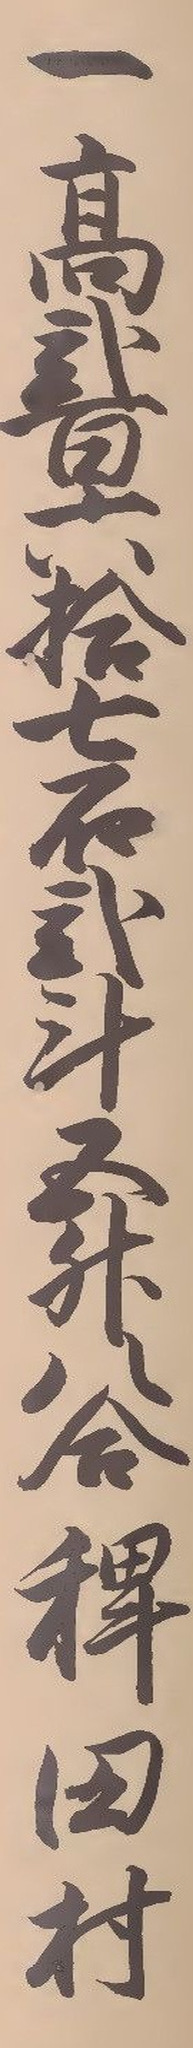一高弐百六拾七石弐斗五升八合稗田村
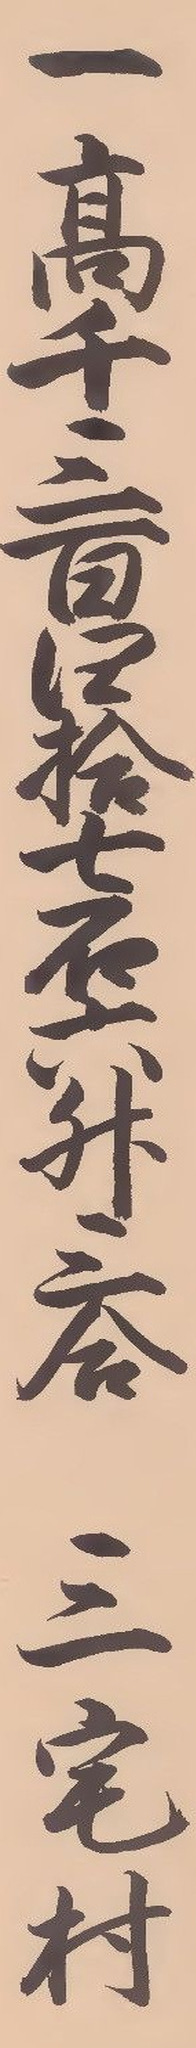一高千三百四拾七石六升三合三宅村
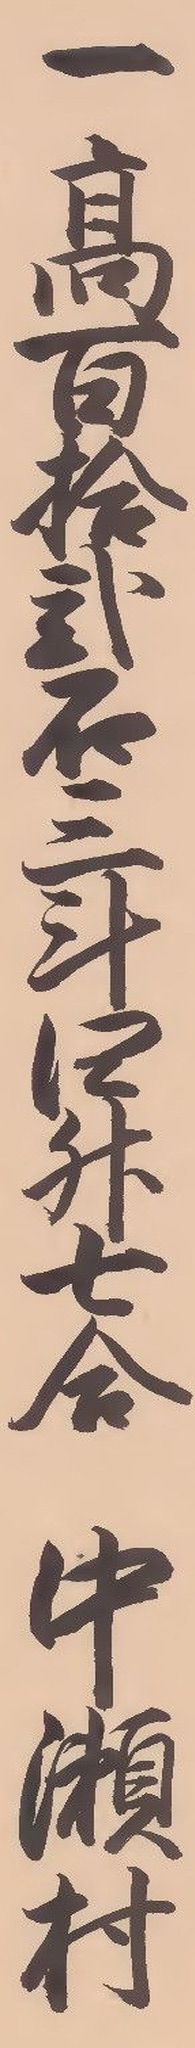一高百拾弐石三斗四升七合中瀬村
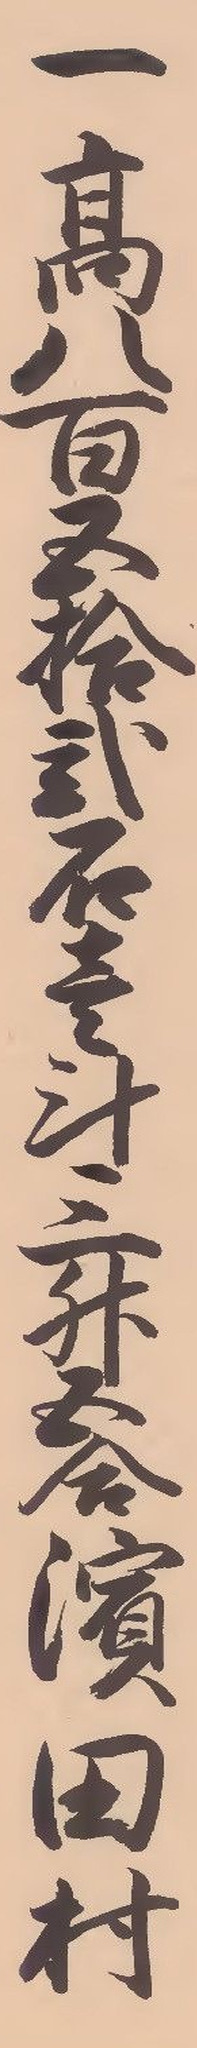一高八百五拾弐石壱斗三升五合浜田村
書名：伊勢国郷帳
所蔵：国立公文書館 National Archives of Japan
